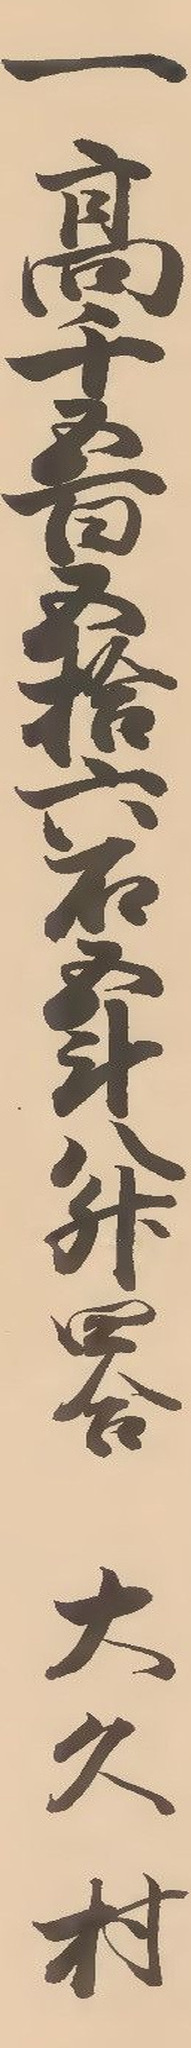一高千五百五拾六石五斗八升四合大久村
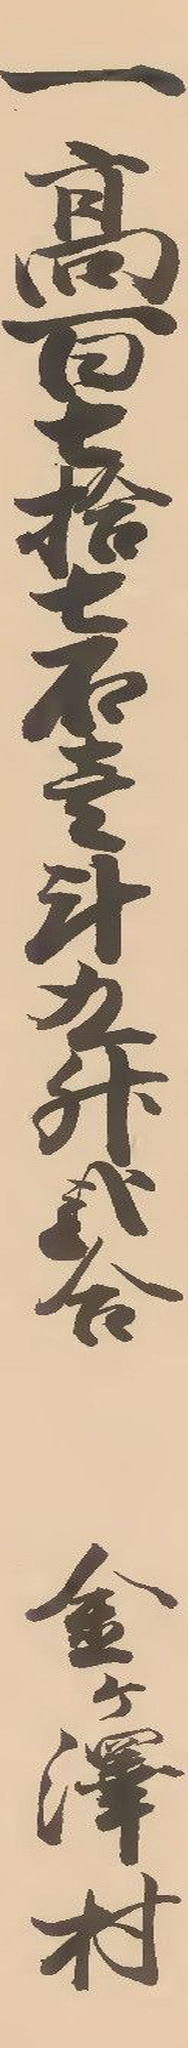一高百七拾七石壱斗九升弐合金ヶ沢村
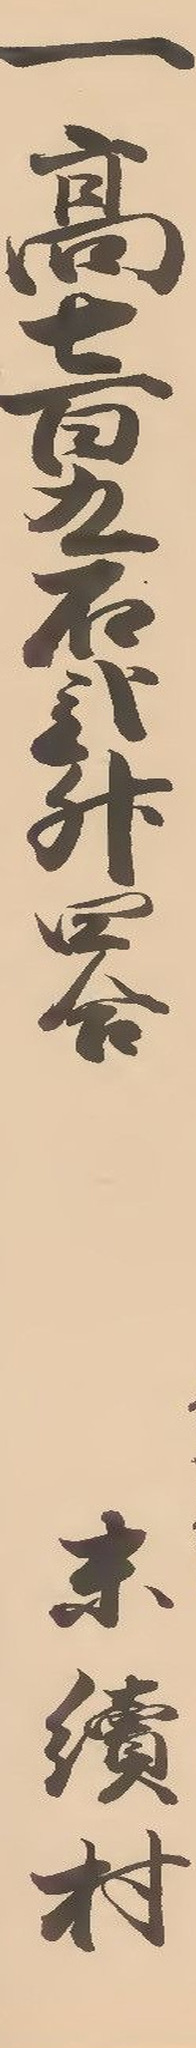一高七百九石弐升四合末続村
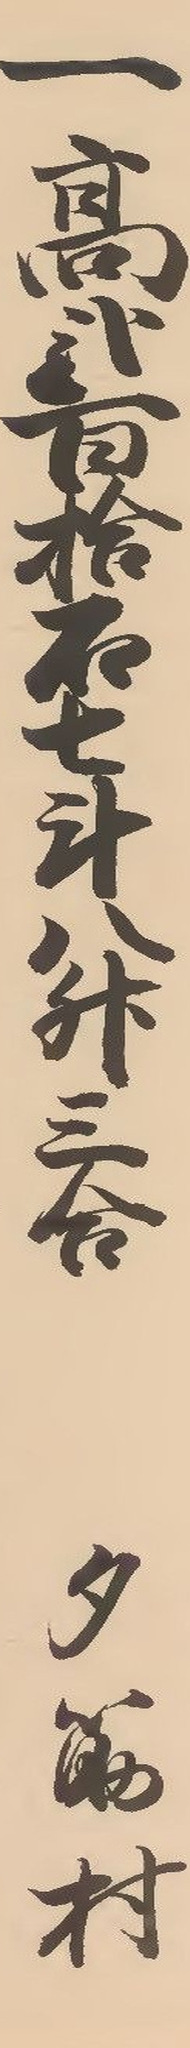一高弐百拾石七斗八升三合夕筋村
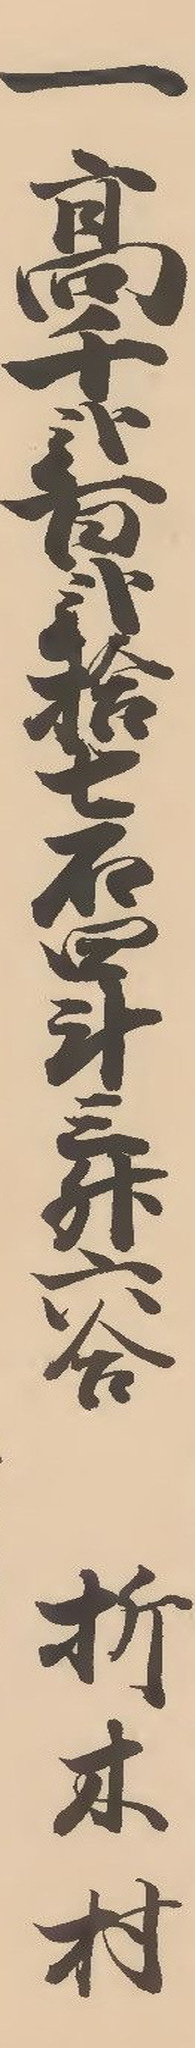一高千弐百拾七石四斗三升六合折木村
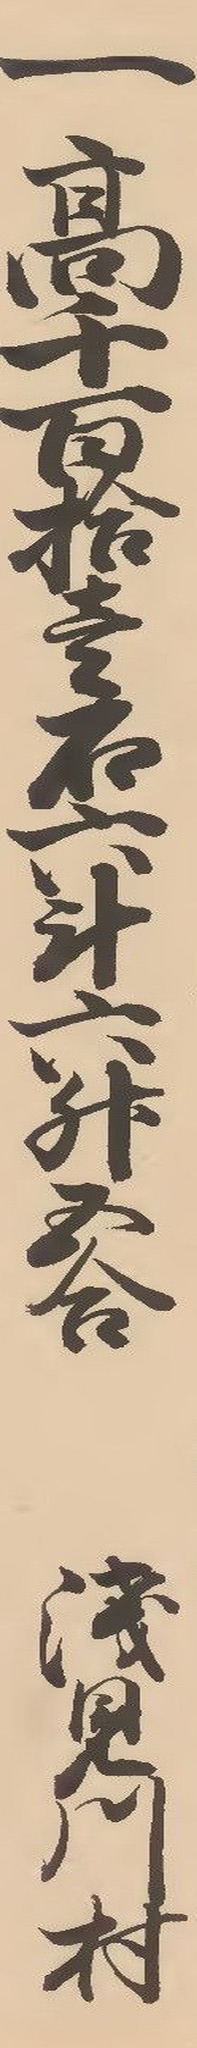一高千百拾壱石六斗六升五合浅見川村
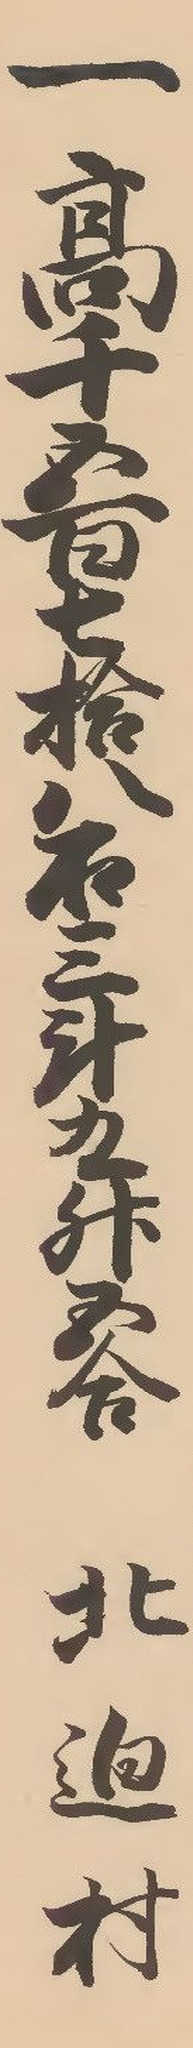一高千五百七拾八石三斗九升五合北迫村

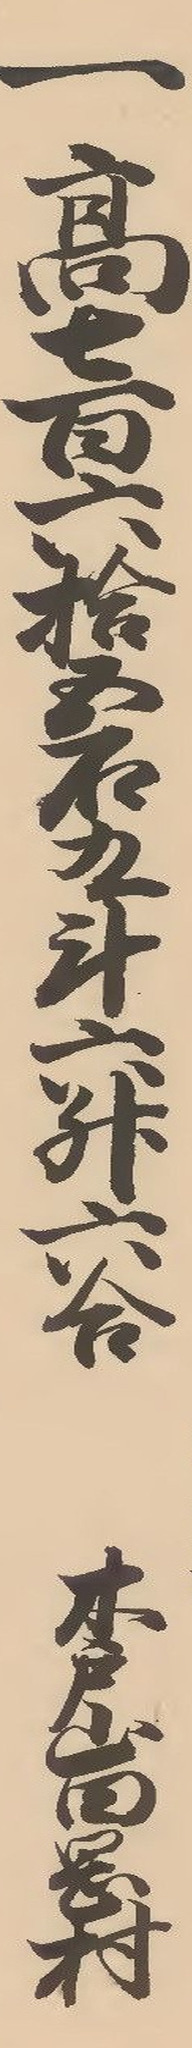一高七百六拾五石九斗六升六谷木戸山田岡村
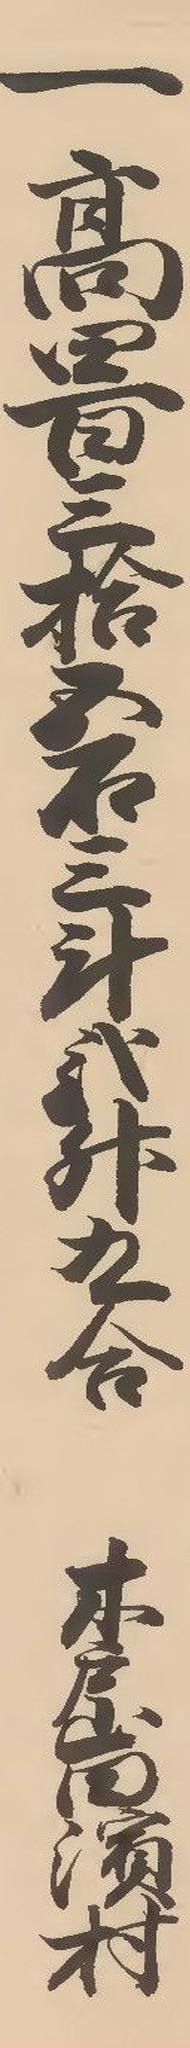一高四百三拾五石三斗弐升九合木戸山田浜村
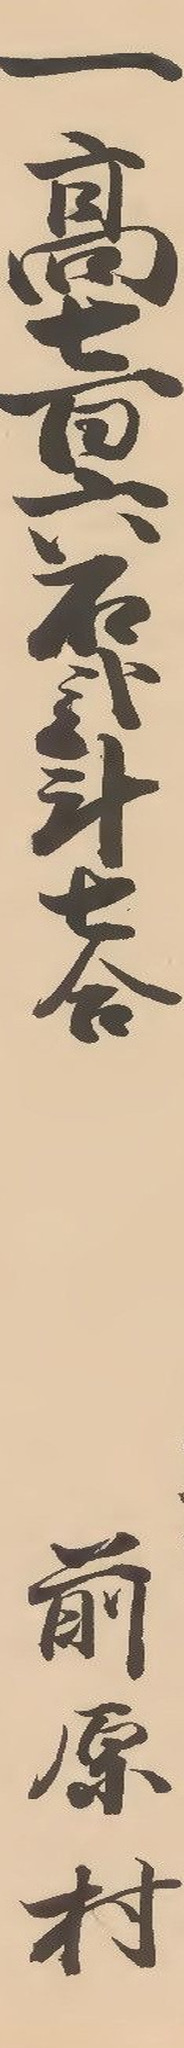一高七百六石弐斗七合前原村
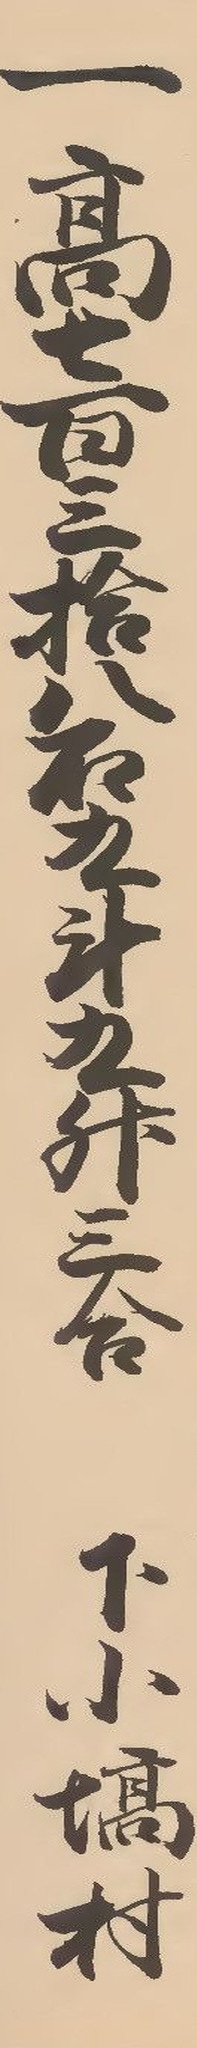一高七百三拾八石九斗九升三合下小塙村
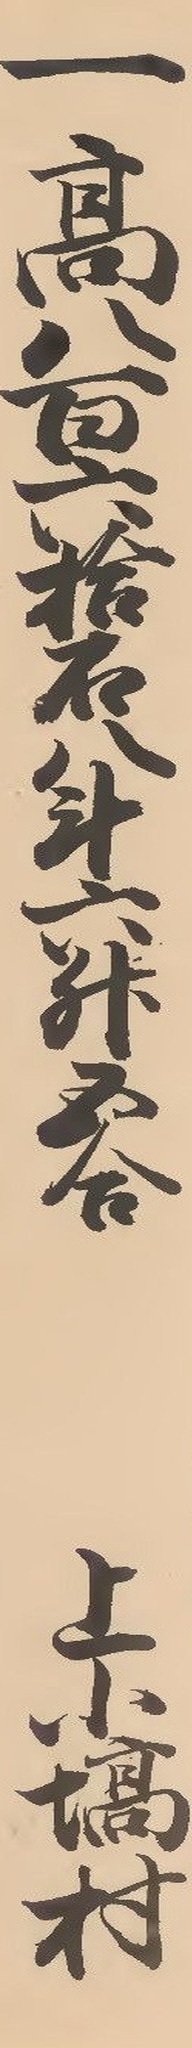一高八百六拾石八斗六升五合上小塙村
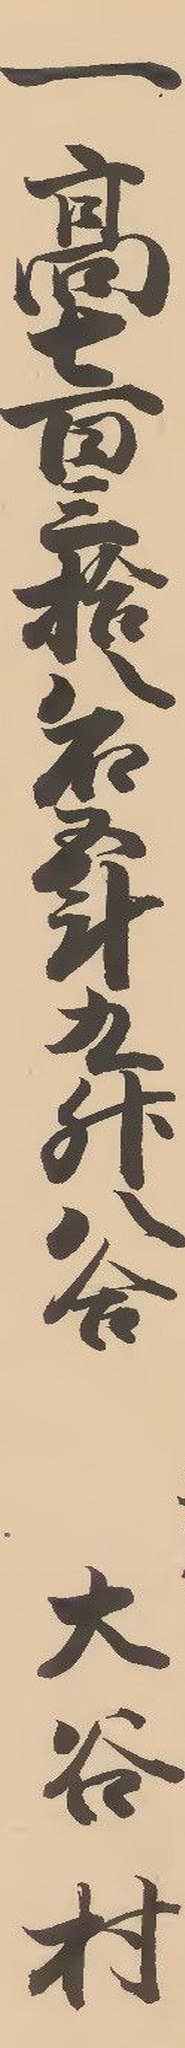一高七百三拾八石五斗九升八合大谷村
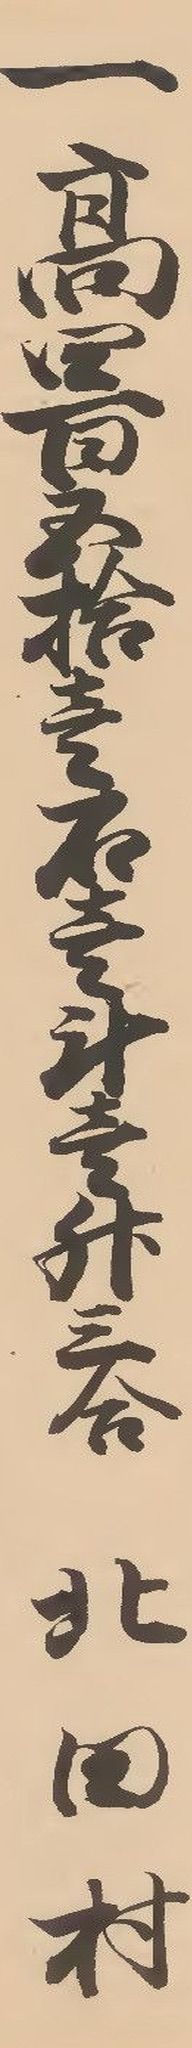一高四百五拾壱石壱斗壱升三合北田村
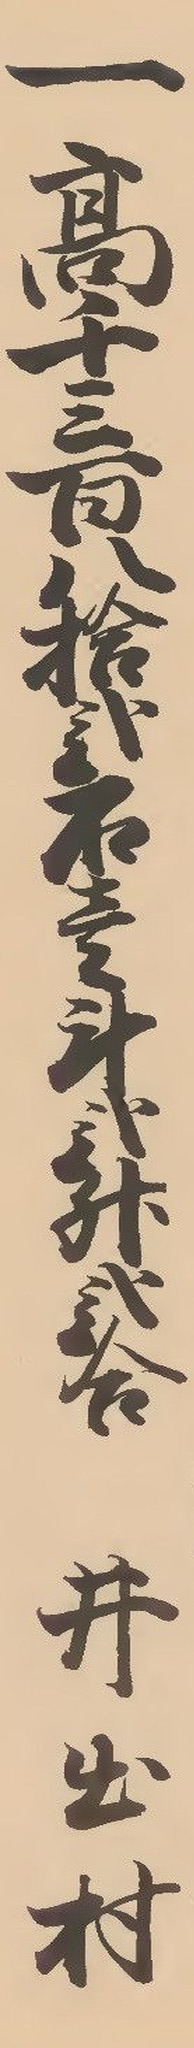一高千三百拾八拾弐石壱斗弐升弐合井出村

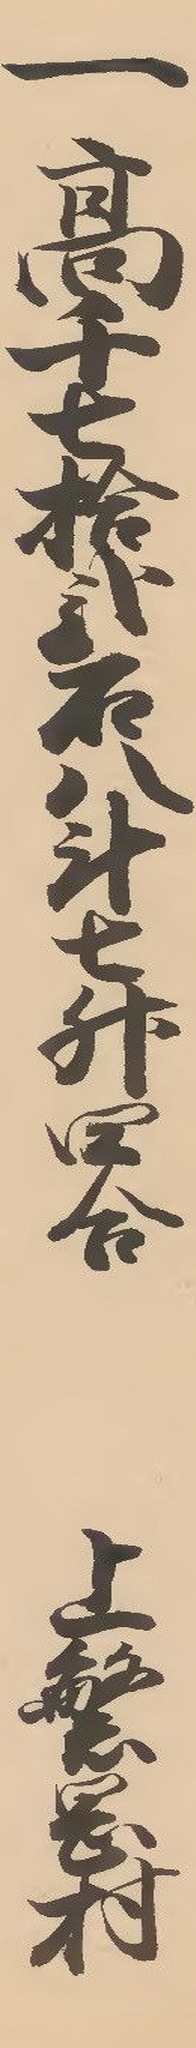一高千七拾弐石八斗七升四合上繁岡村
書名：陸奥国郷帳　３
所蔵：国立公文書館 National Archives of Japan
